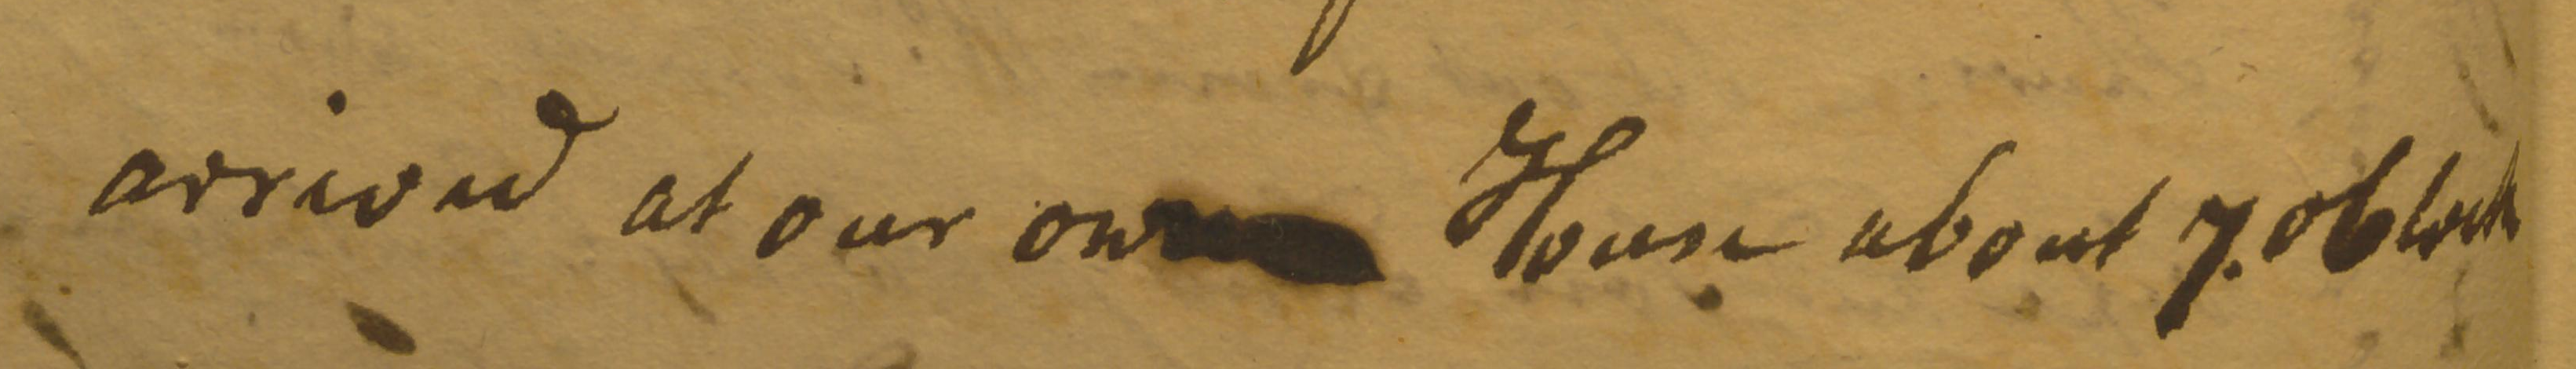arrived at our own House about 7 oClock.
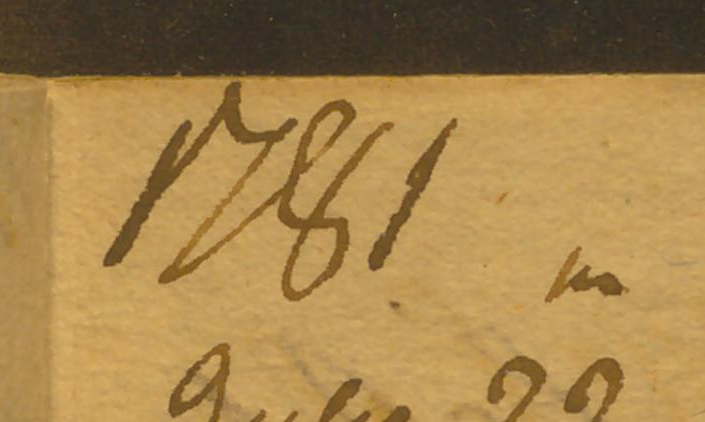1781
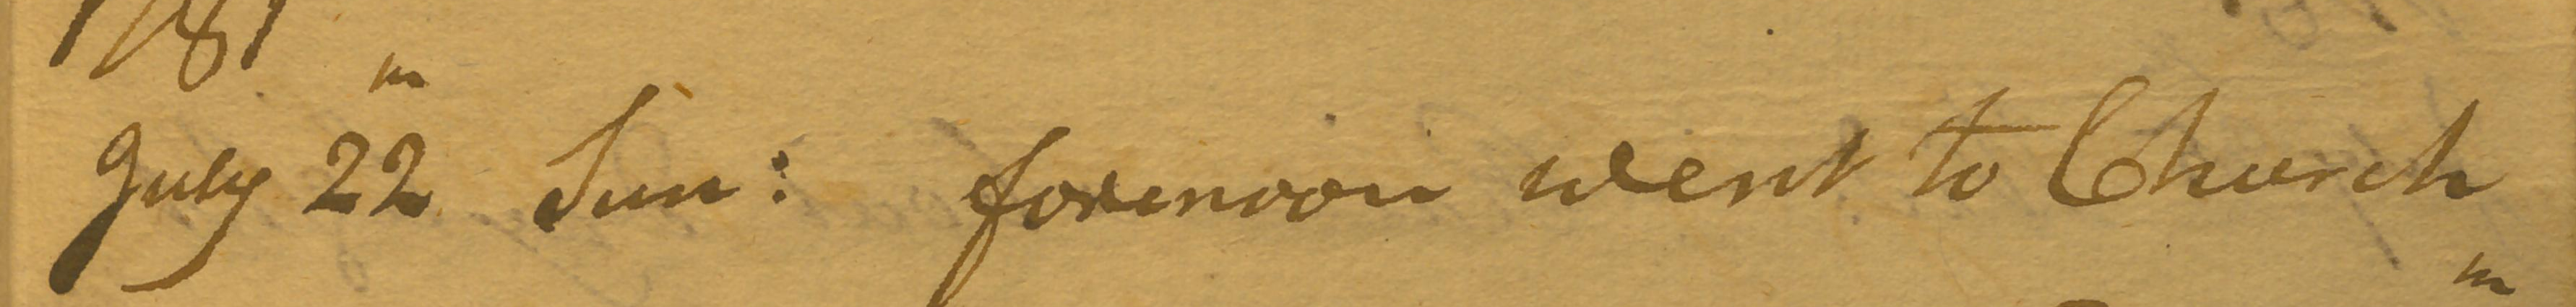July 22^th Sun: forenoon went to Church
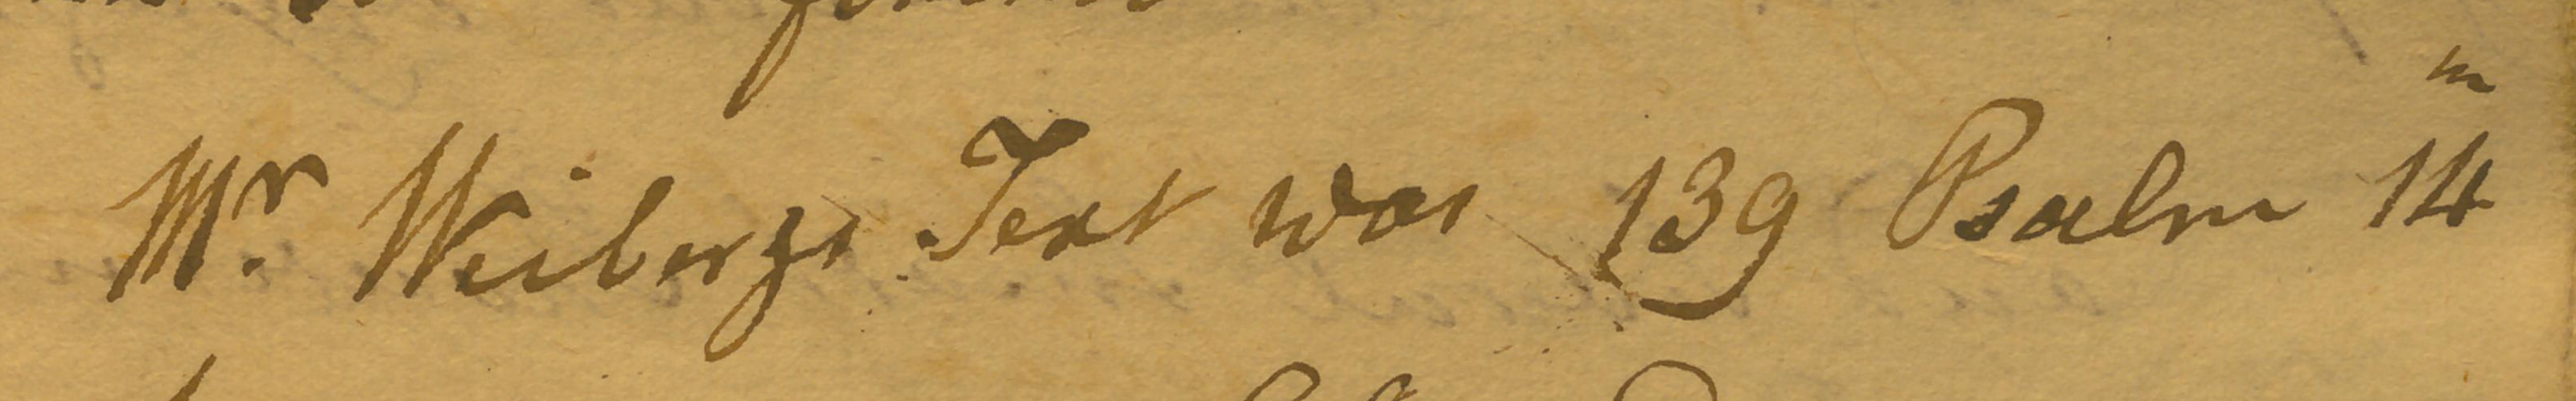M^r. Weibergs Text was 139 Psalm 14^th
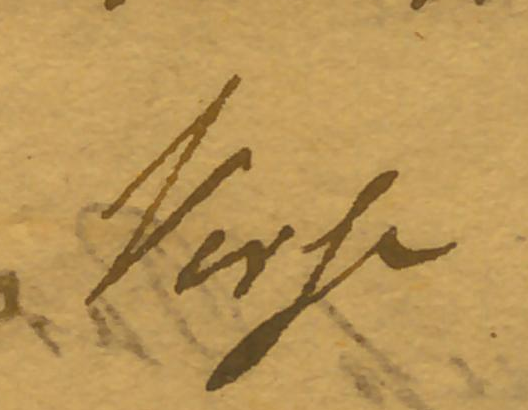Verse
